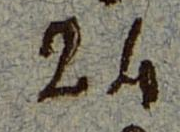24
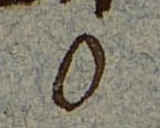0
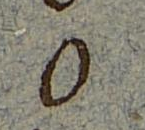0
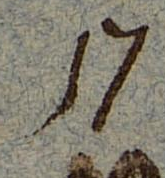17
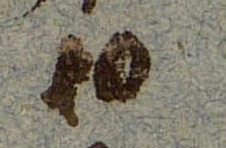10
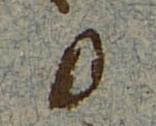0
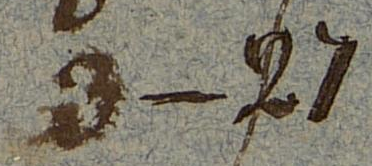3-27
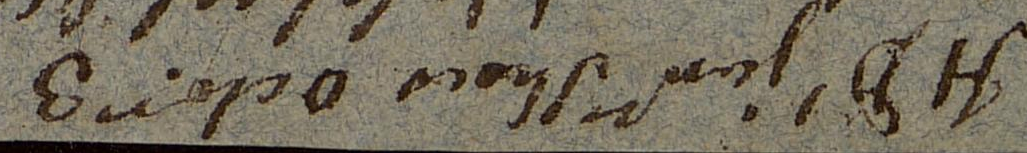HD' jun^r Shoes Octo^r. 3
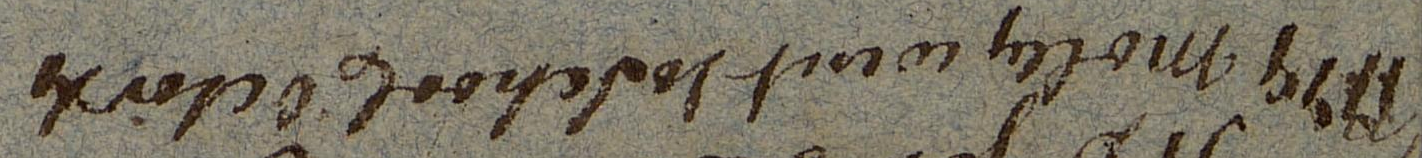1779 Molly went to School Octor 4
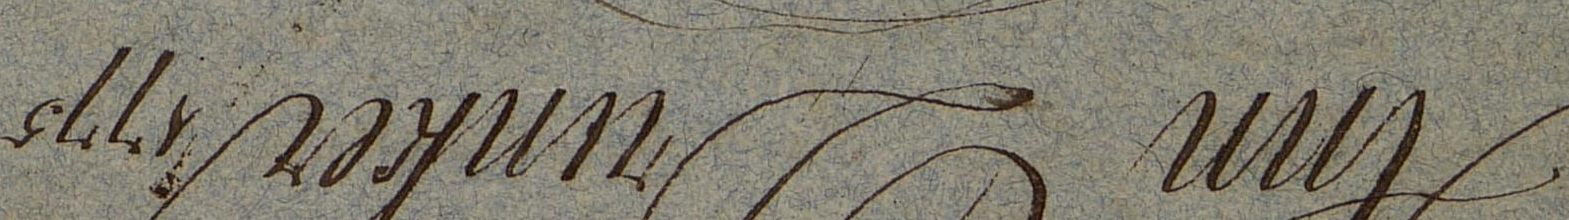Ann Drinker 1775
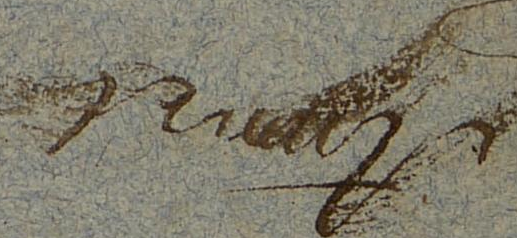Ann
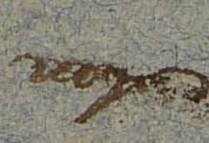Ann
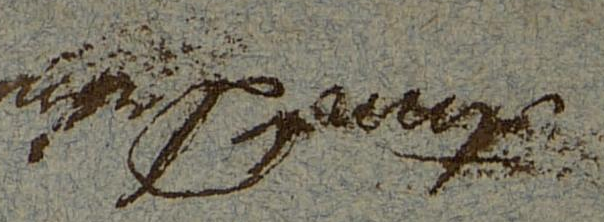Ann Drink
